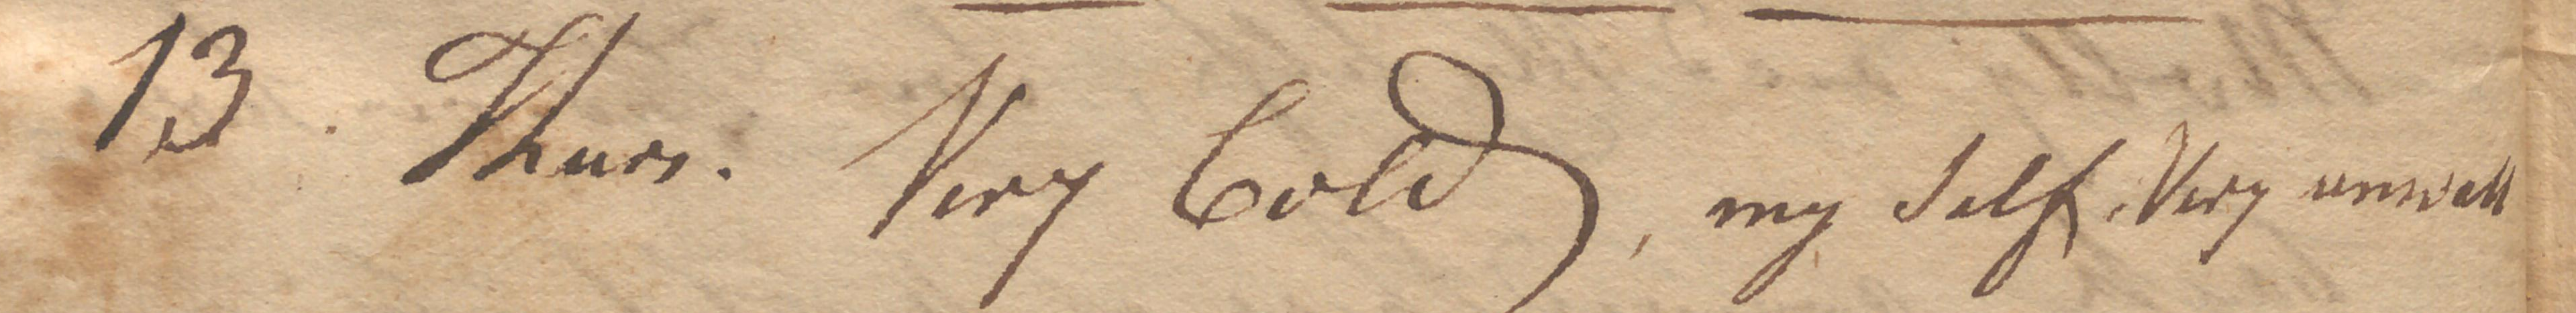13. Thurs.Very Cold my self Very unwell
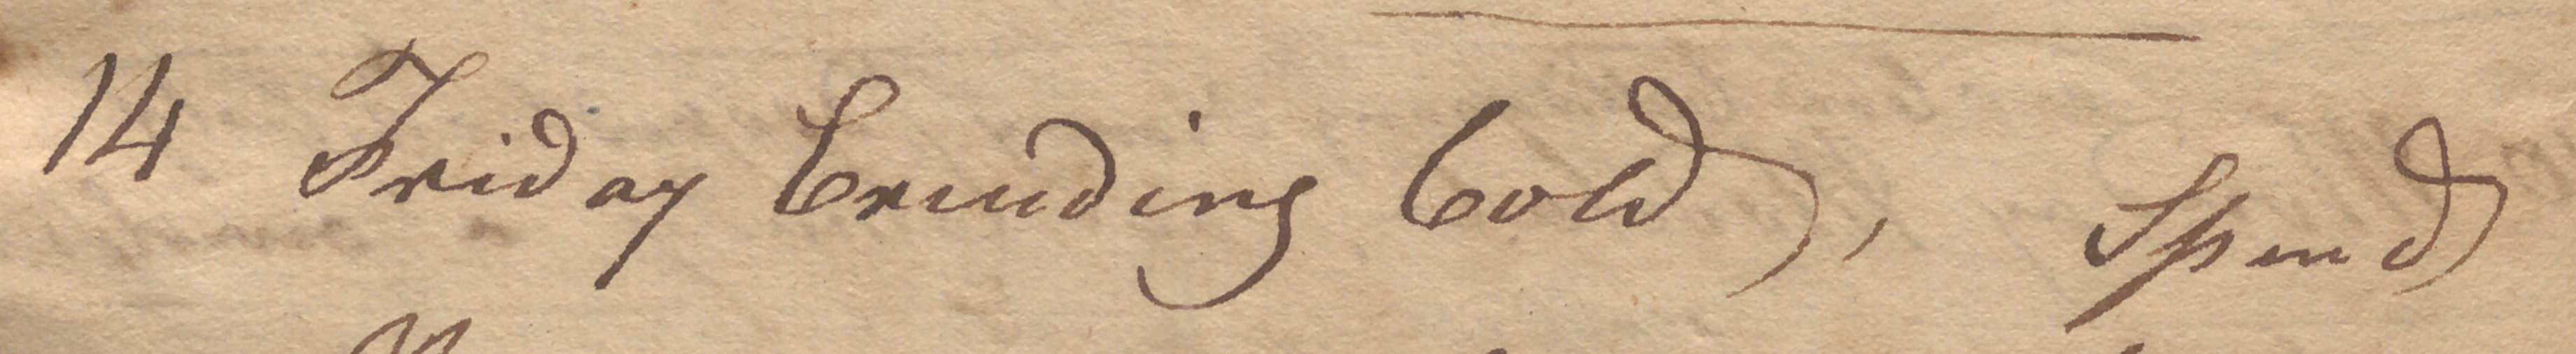14 Friday Exceeding Cold, spend
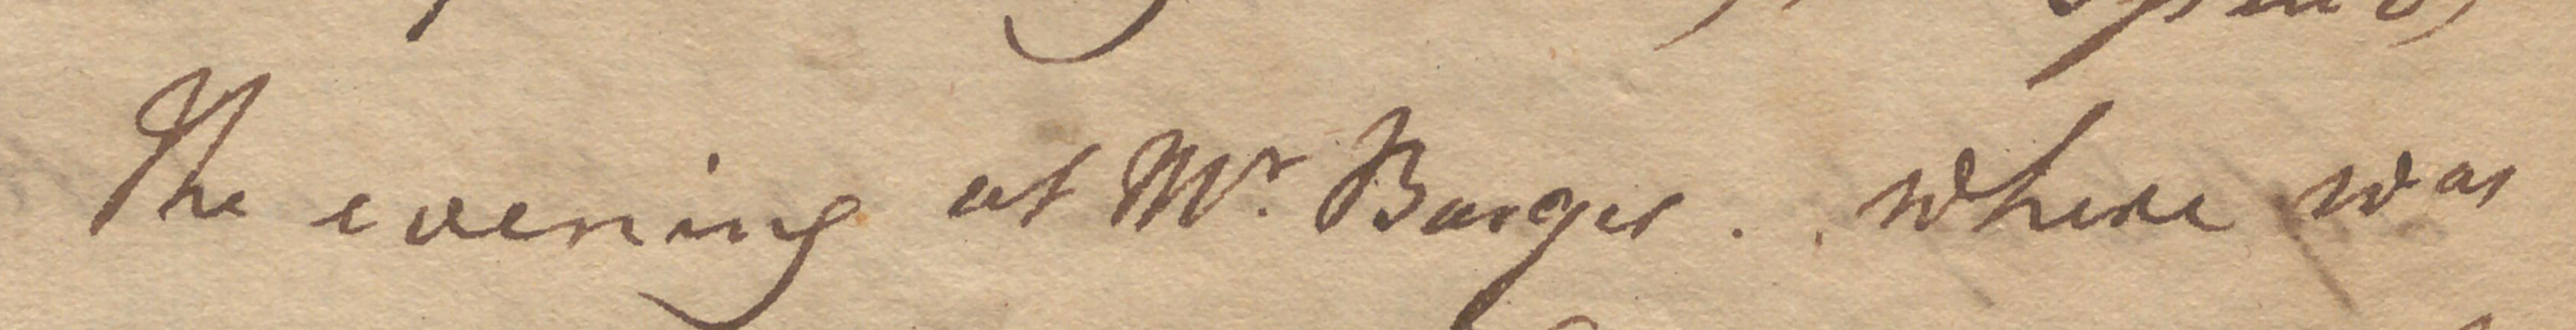The evening at M^r. Barges. where was
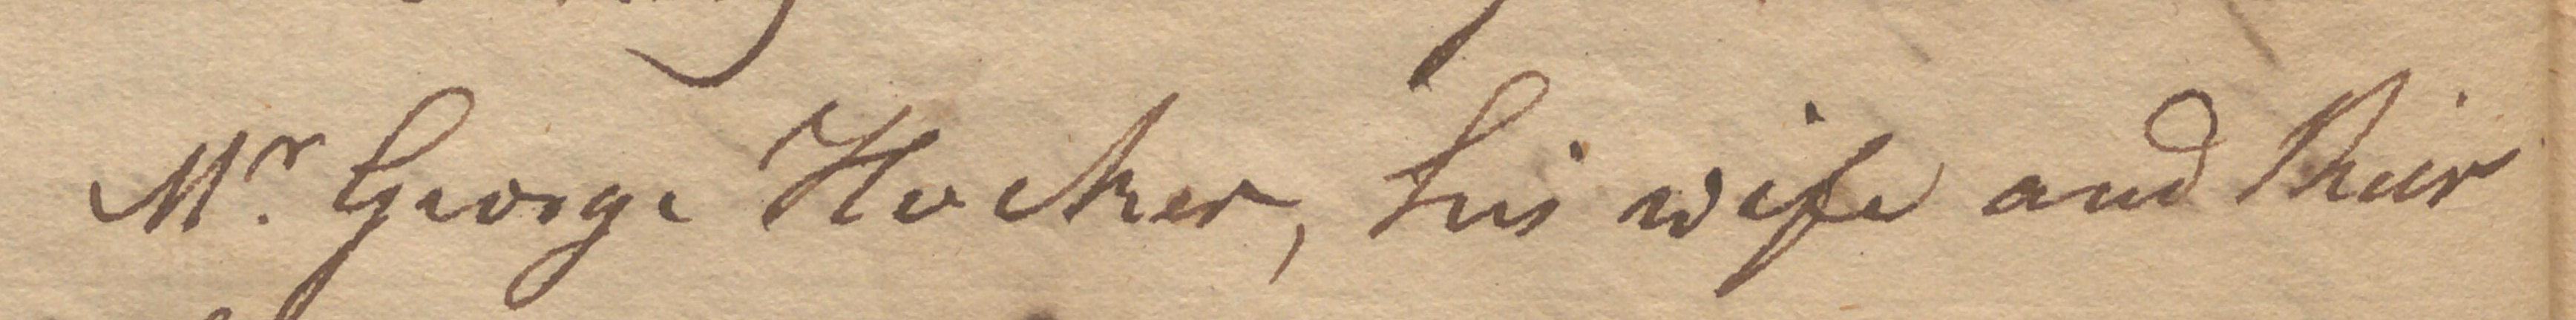M^r. George Hocker, his wife and their
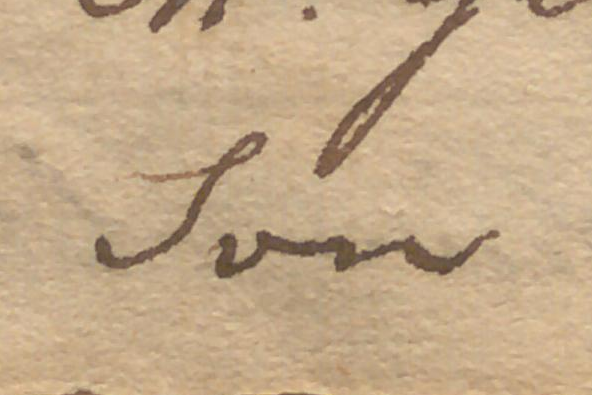son
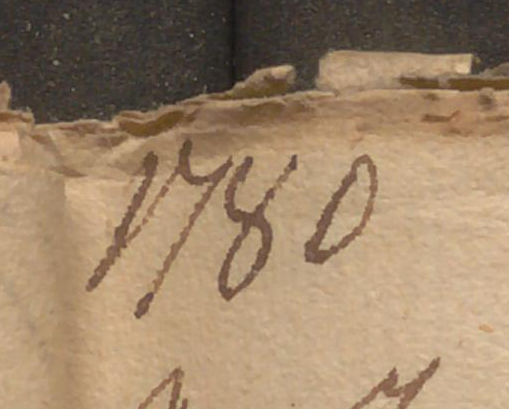1780
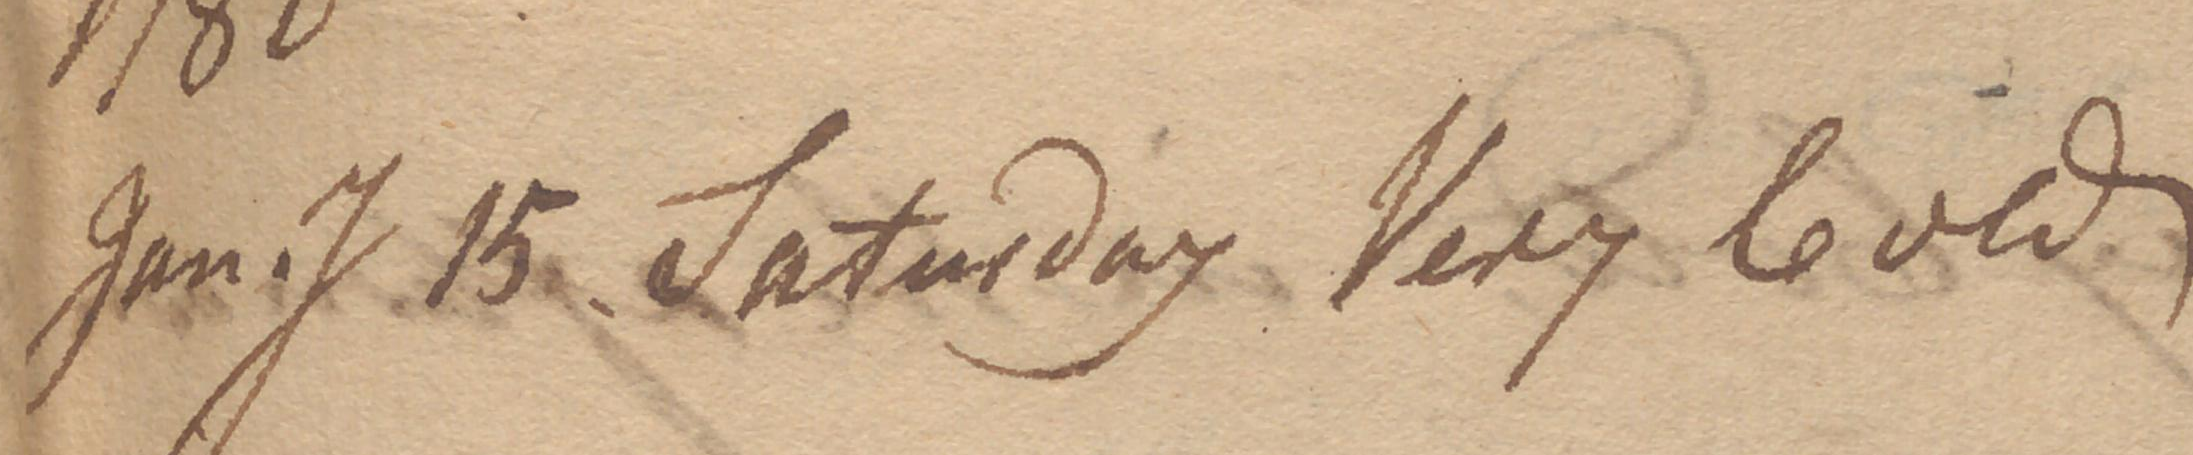Jan^y. 15. Saturday Very Cold
